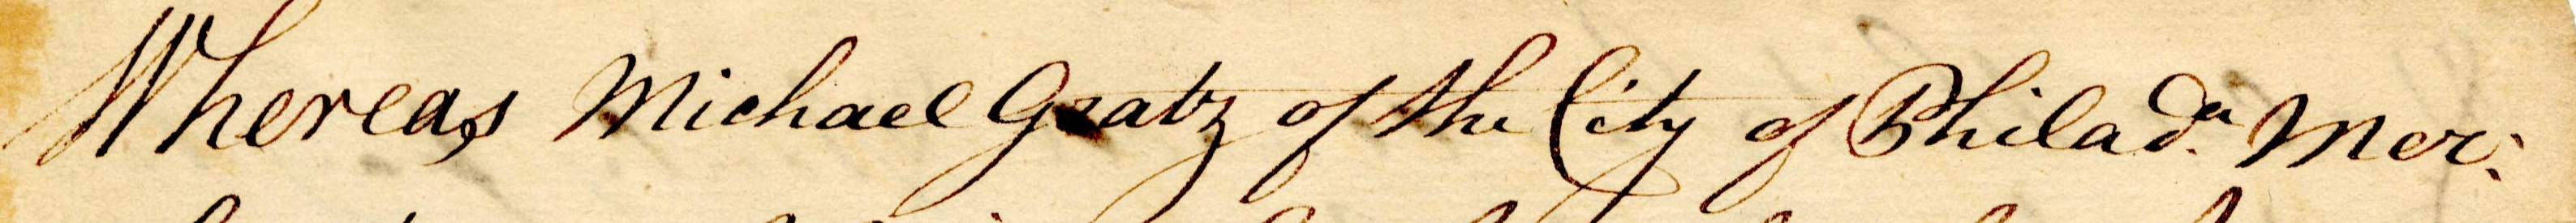Whereas Michael Gratz of the City of Philad^a. Mer-
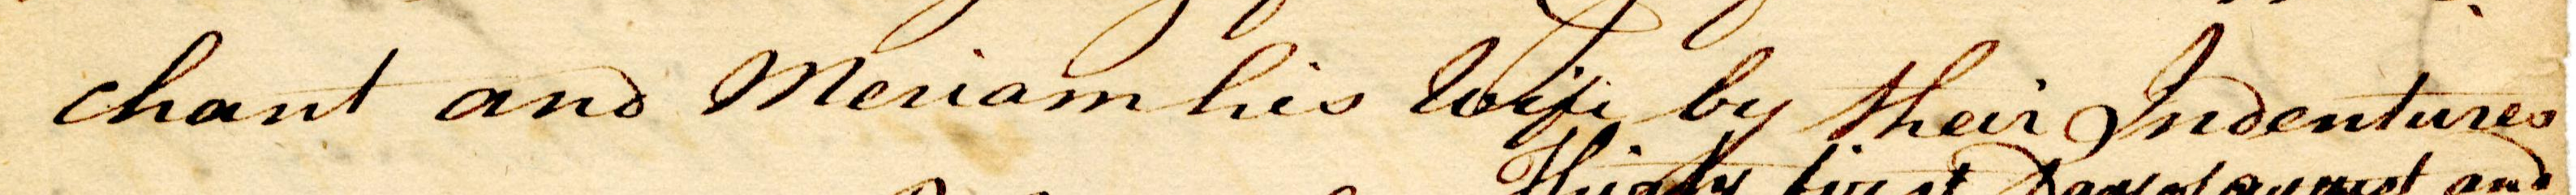-chant and Meriam his wife, by their Indentures
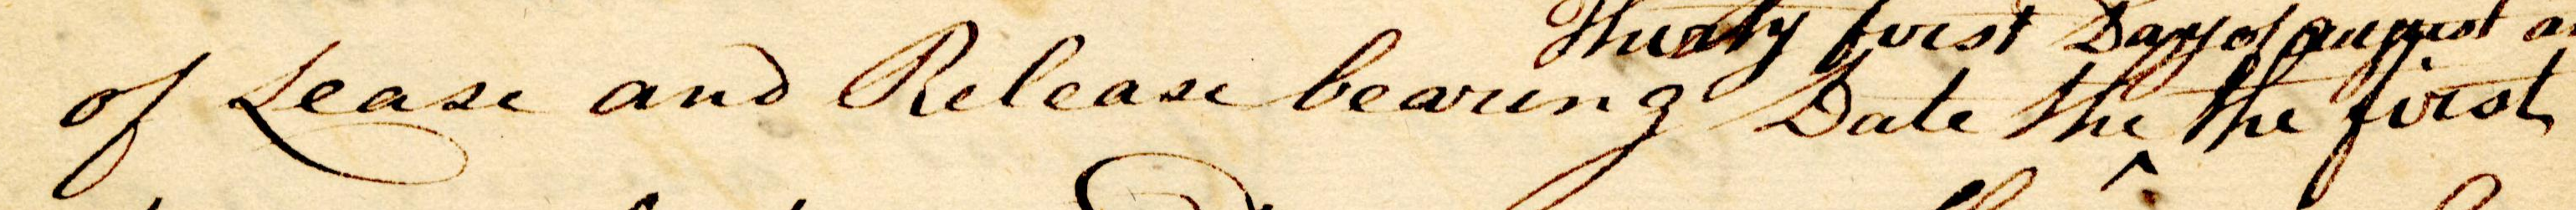of Lease and Release bearing Date the ^ the first
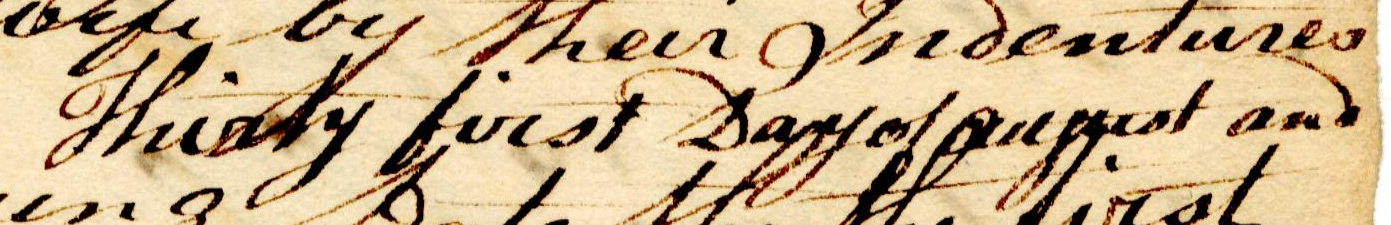Thirty first Day of August and
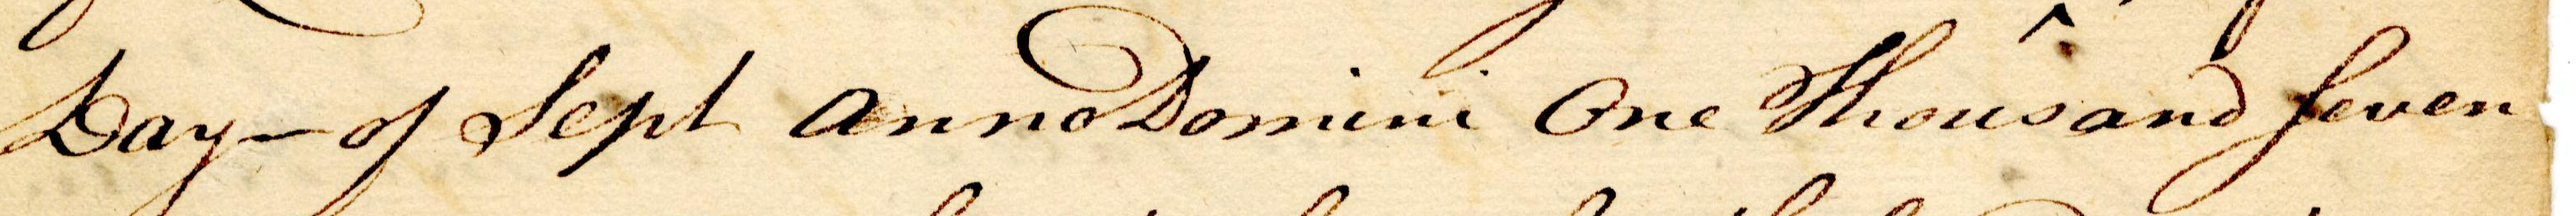Day- of Sept Anno Domini One Thousand Seven
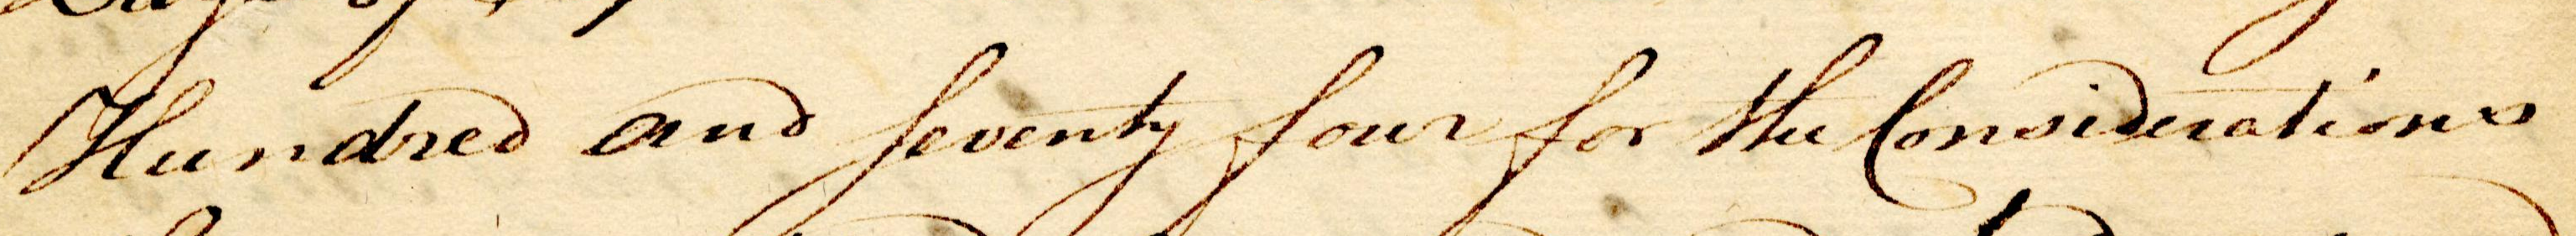Hundred and seventy four for the Considerations
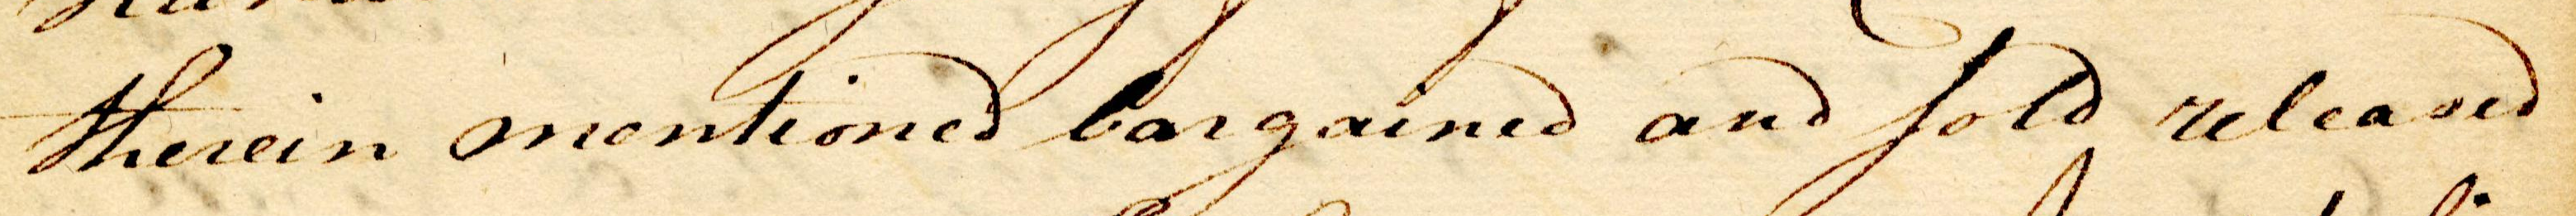therein mentioned bargained and sold released
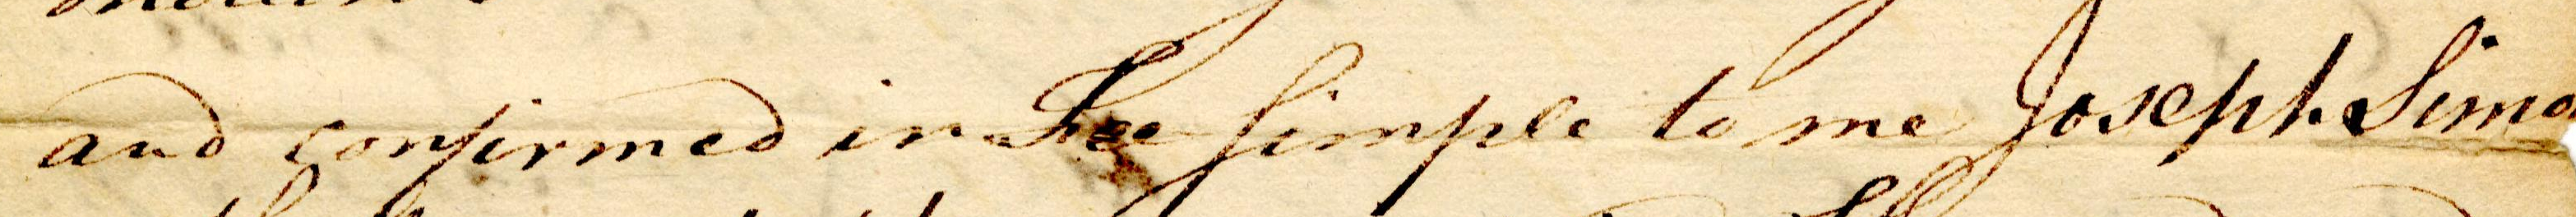and confirmed in the simple to me Joseph Simon
